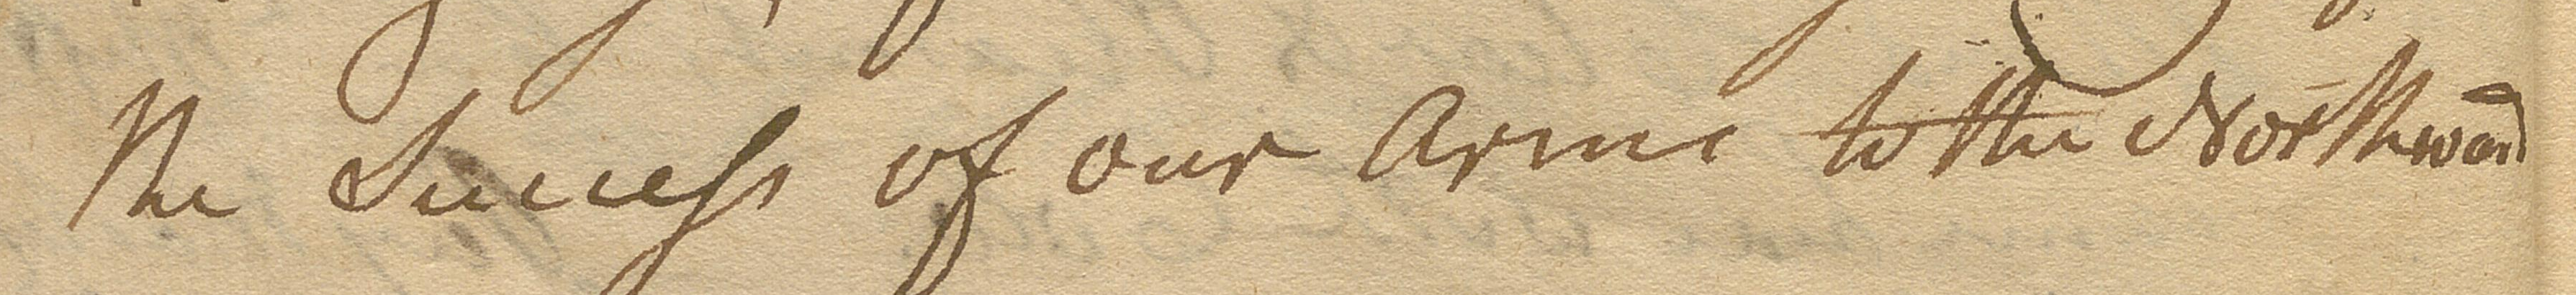the suceess of our Arms to the Northward
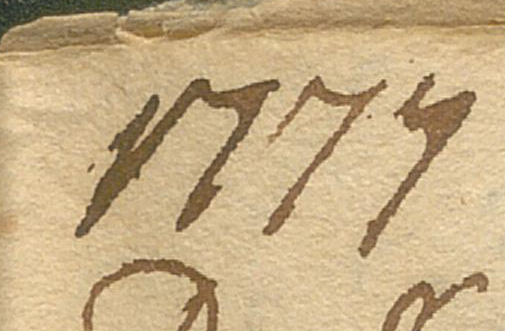1777
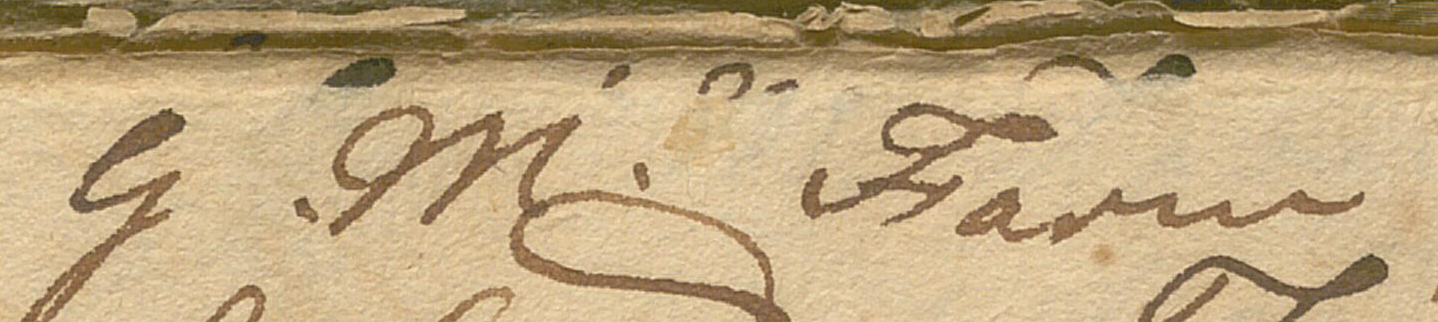G. M. Farm
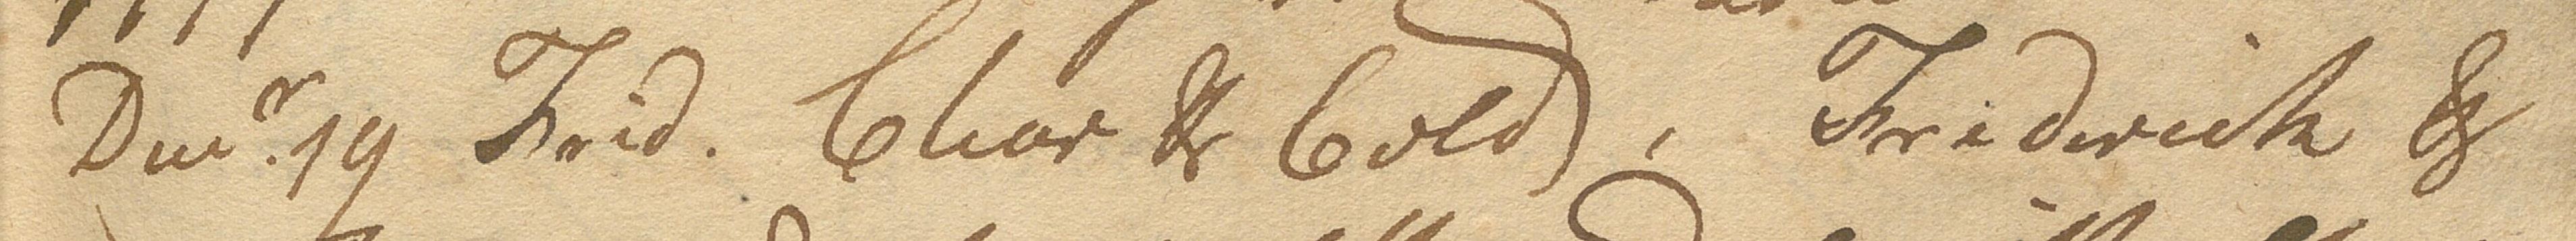Dec^r. 19 Frid. Clear & Cold. Friderick &
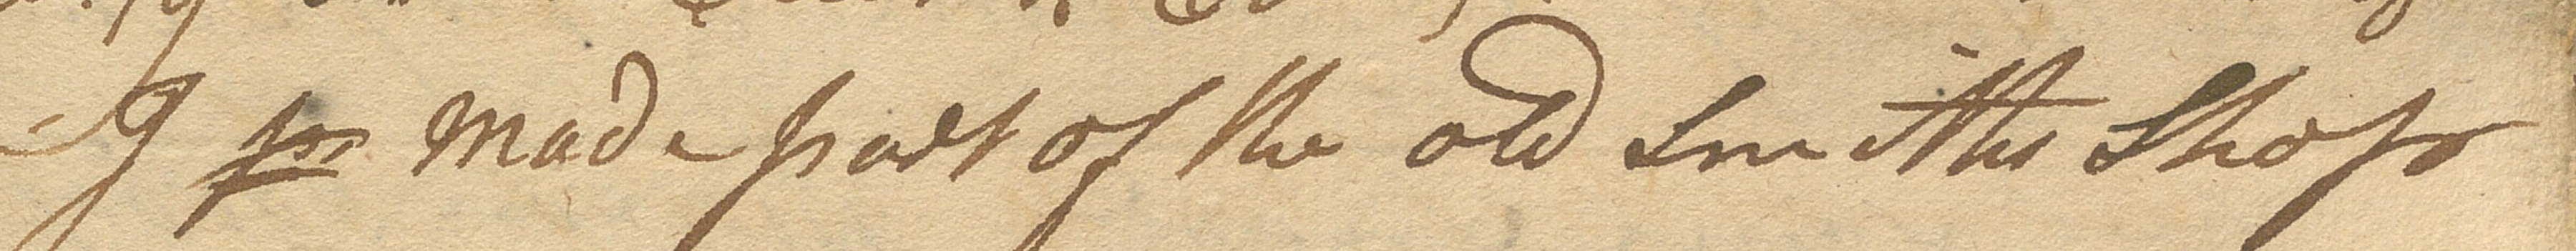I [_] made part of the old Smiths Shop
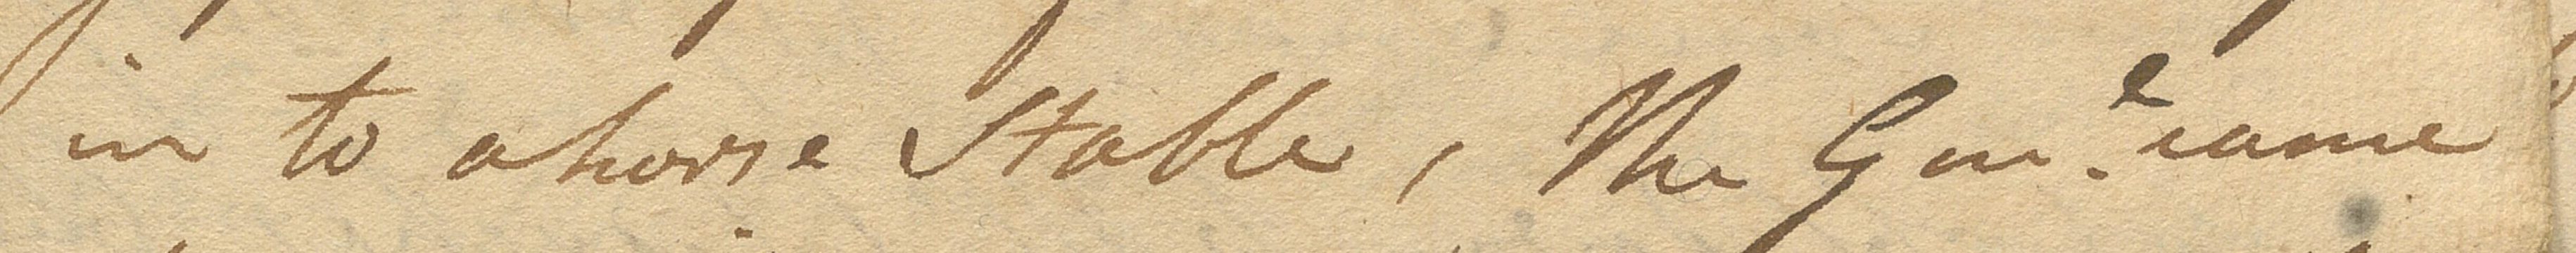in to a horse Stable, the Gen^l. came
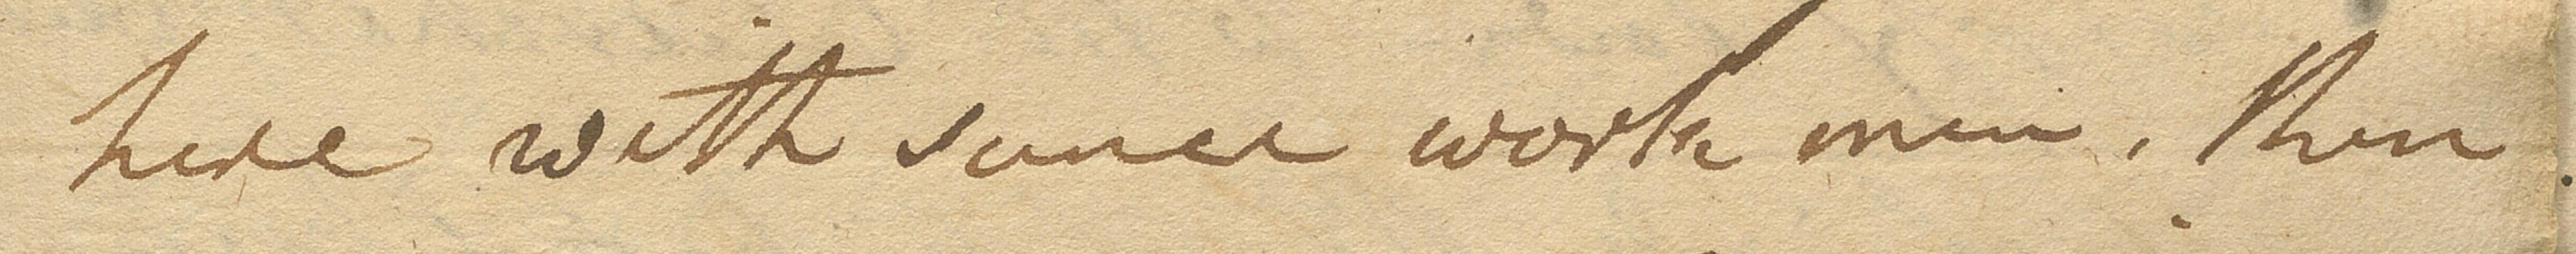here with some work men, then
